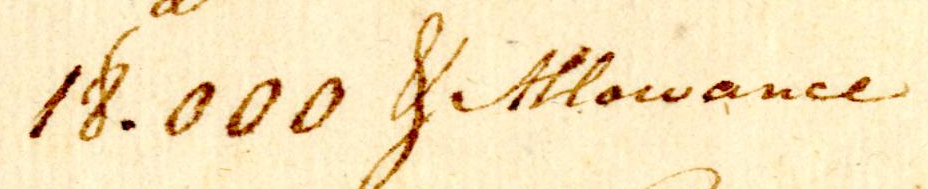18.000 & Allowance
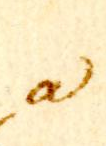@
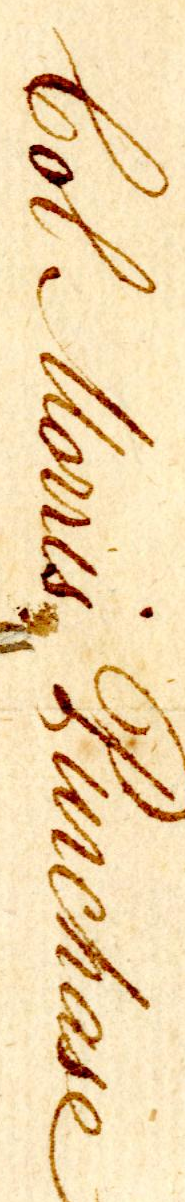Col. Morris Purchase
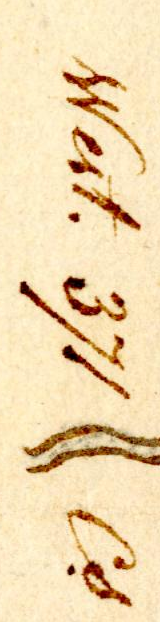West. 371 C^s.
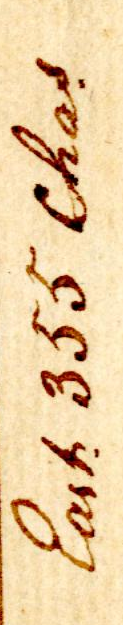East. 355 Cha^s.
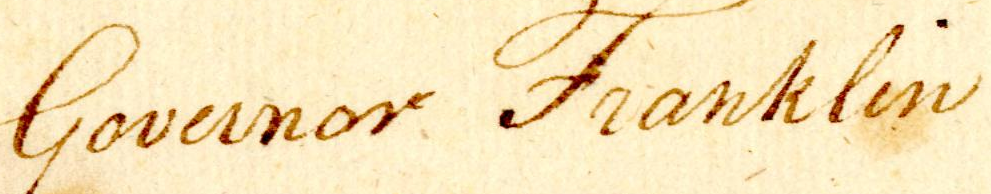Governor Franklin
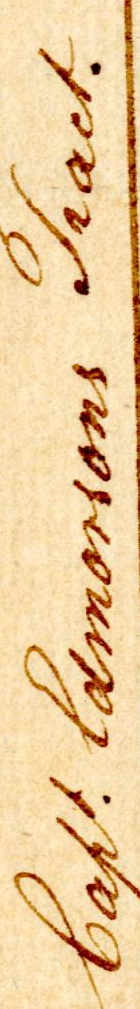Cap^t. Edmorsons Tract.
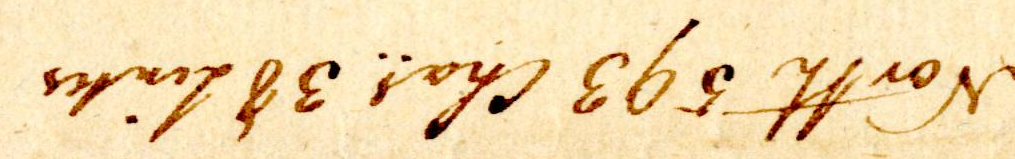North 593 Cha^s. 38 Links
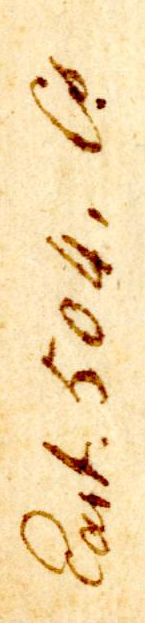East. 504. C^s.
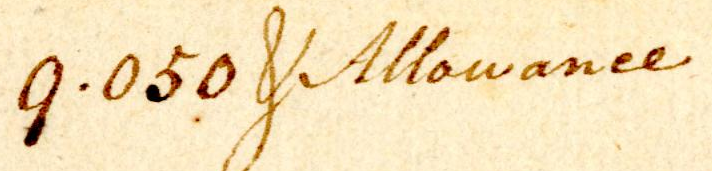9. 050 & Allowance
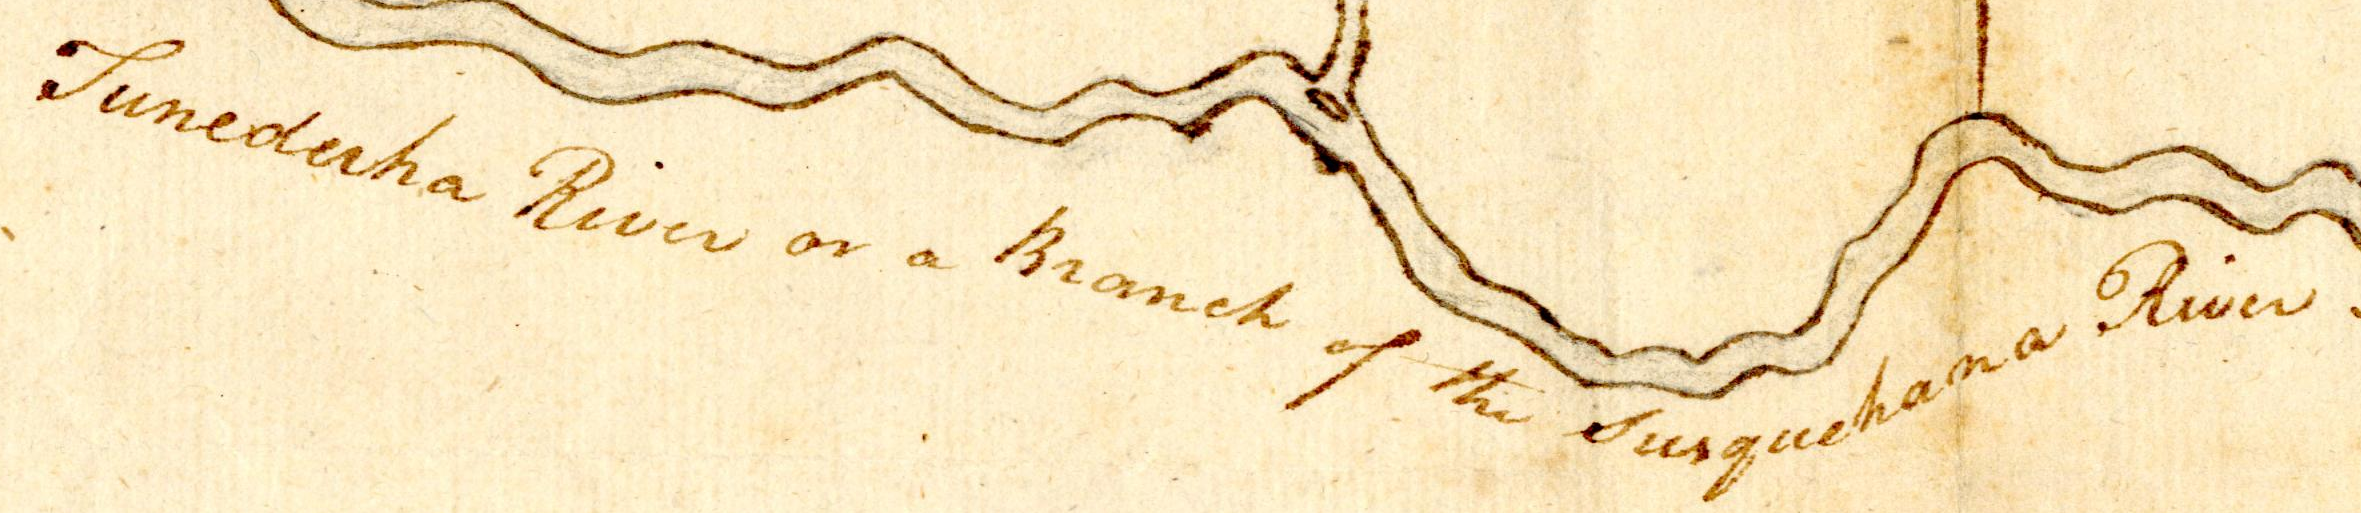Tunederha River on branch of the Susquehanna River
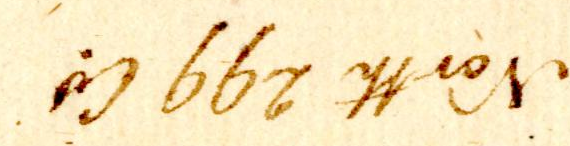North 299 C^s.
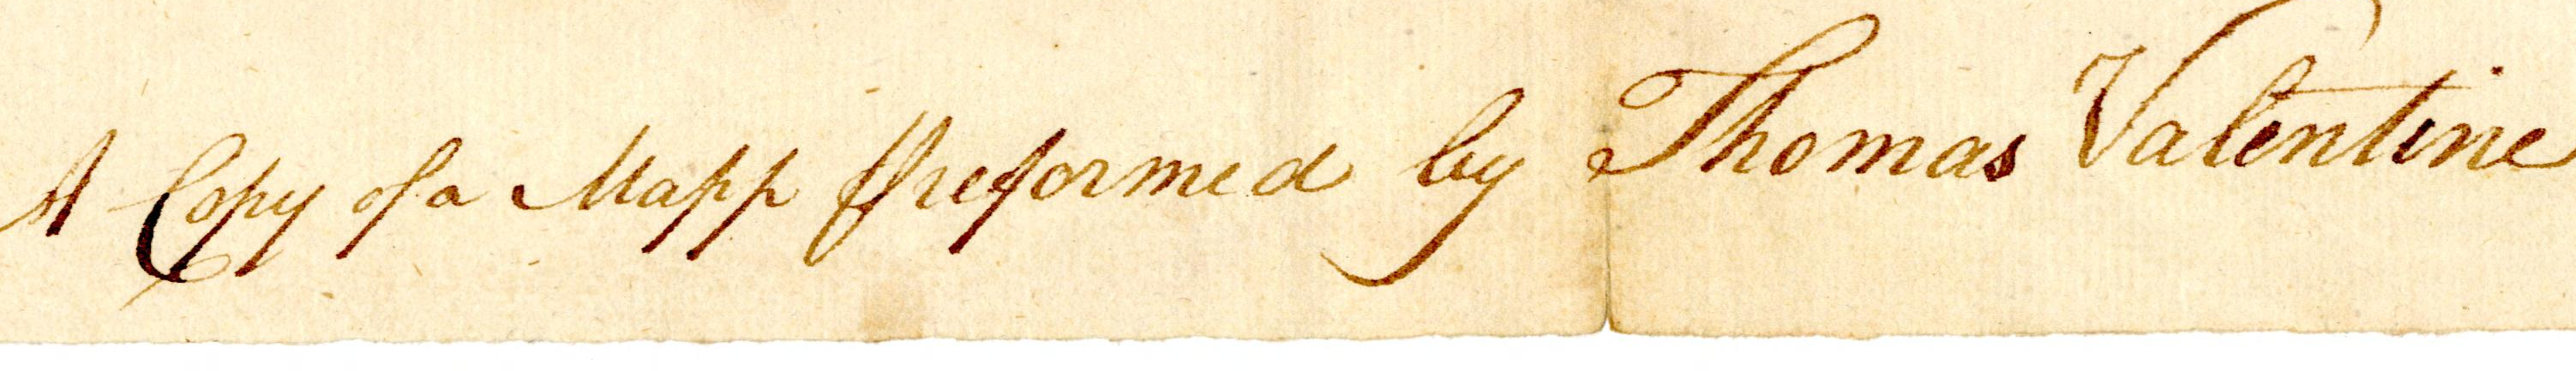A Copy of a Mapp preformed by Thomas Valentine
